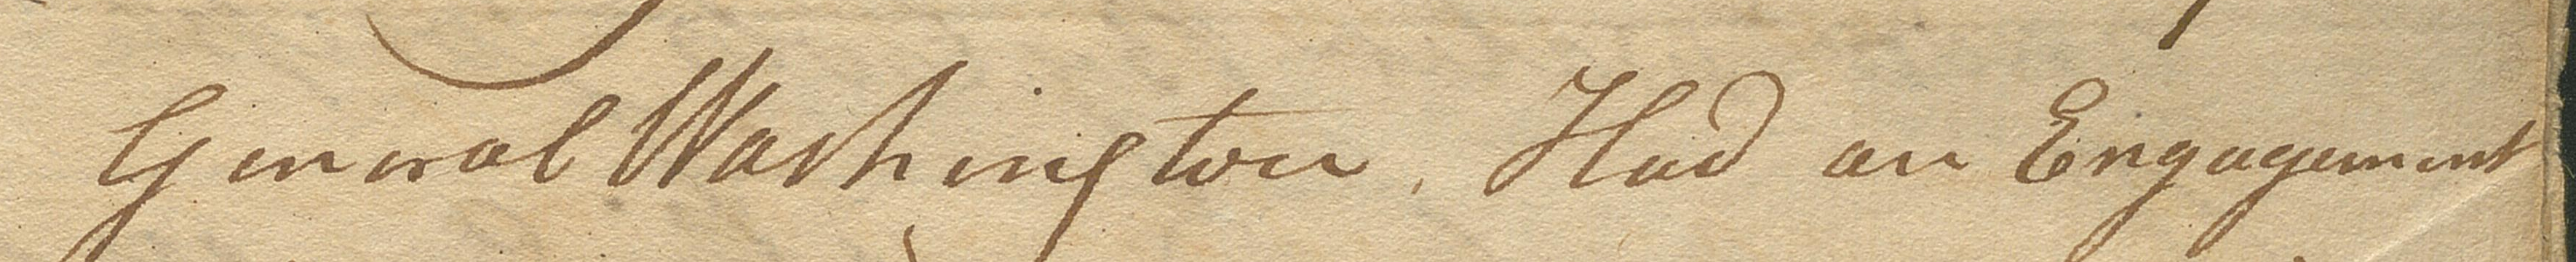General Washington, Had an Engagement
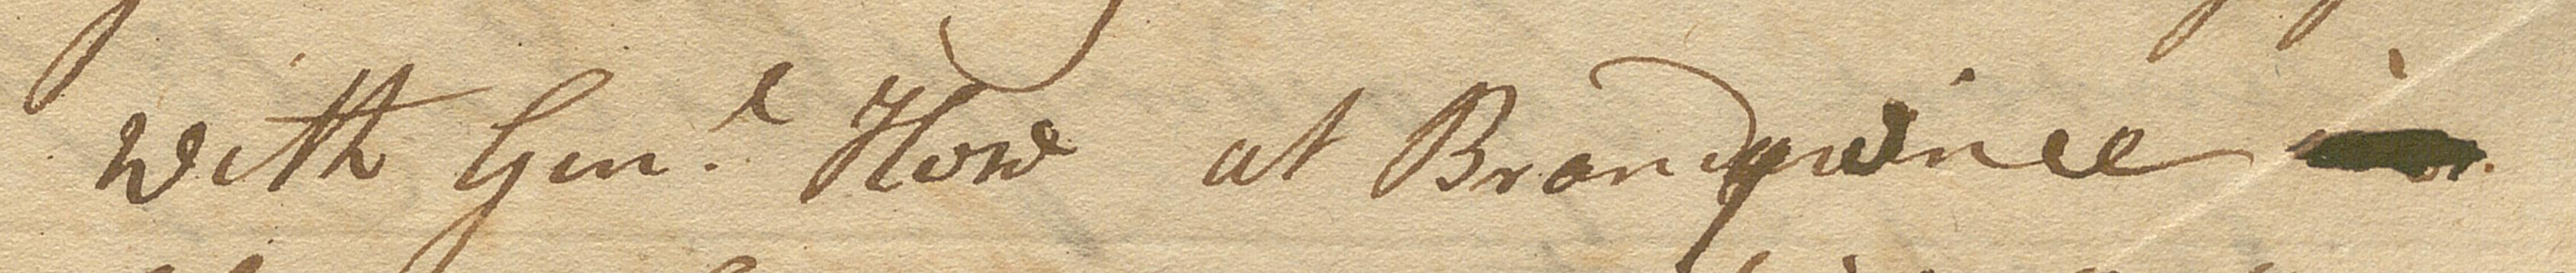with Gen^l. How at Brandywine [___]
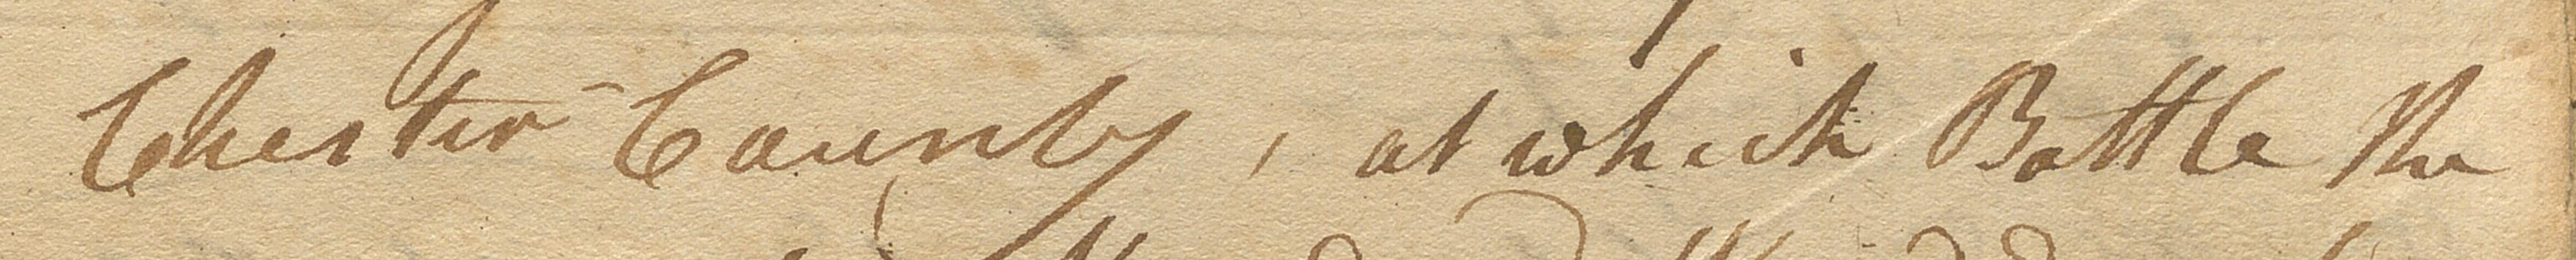Chester County, at which Battle the
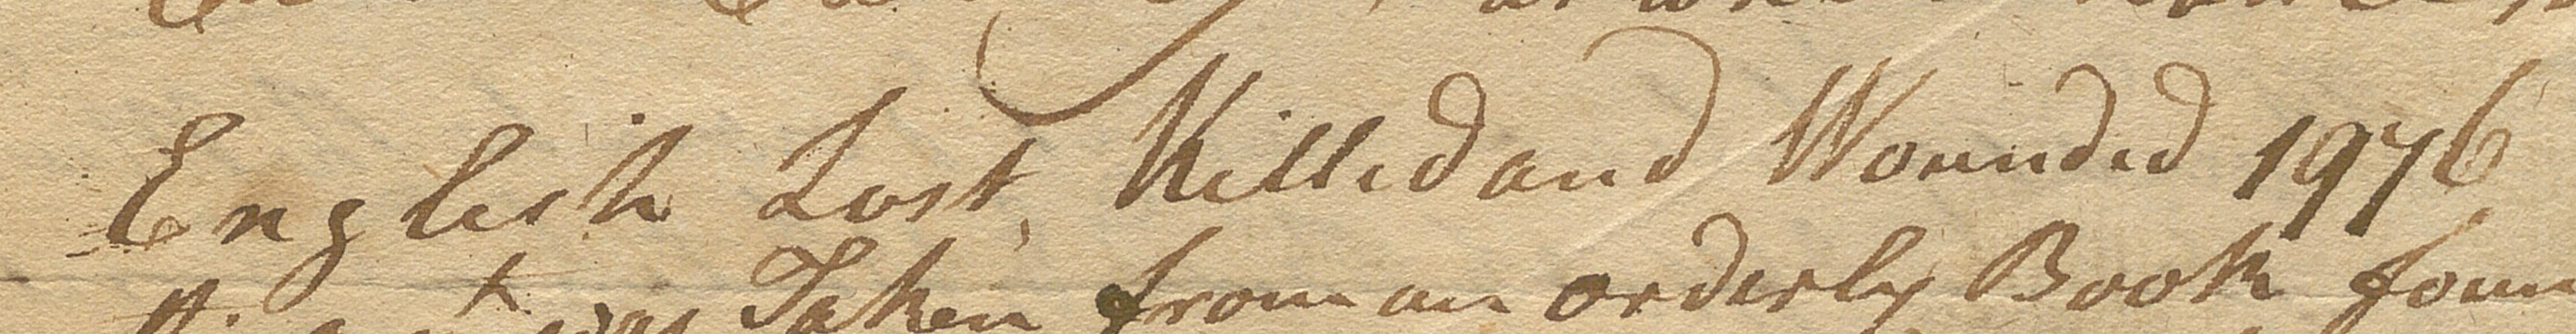English Lost, Killed and Wounded 1976
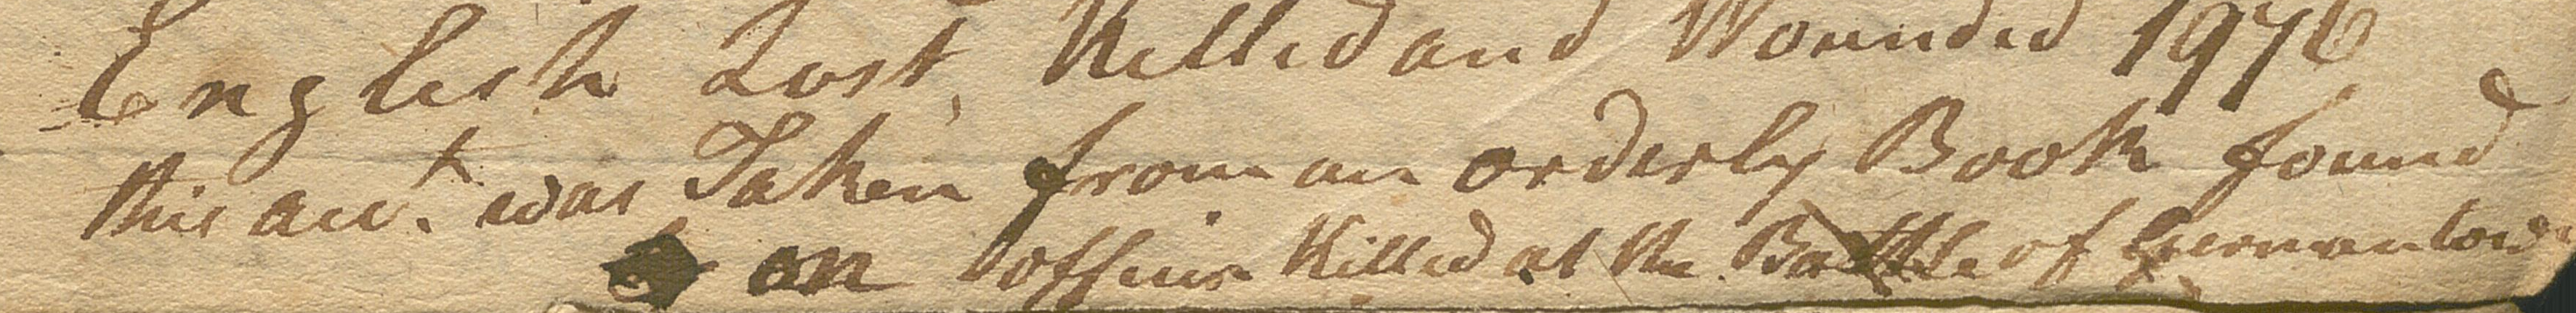this acc^t. was Taken from an orderly Book found
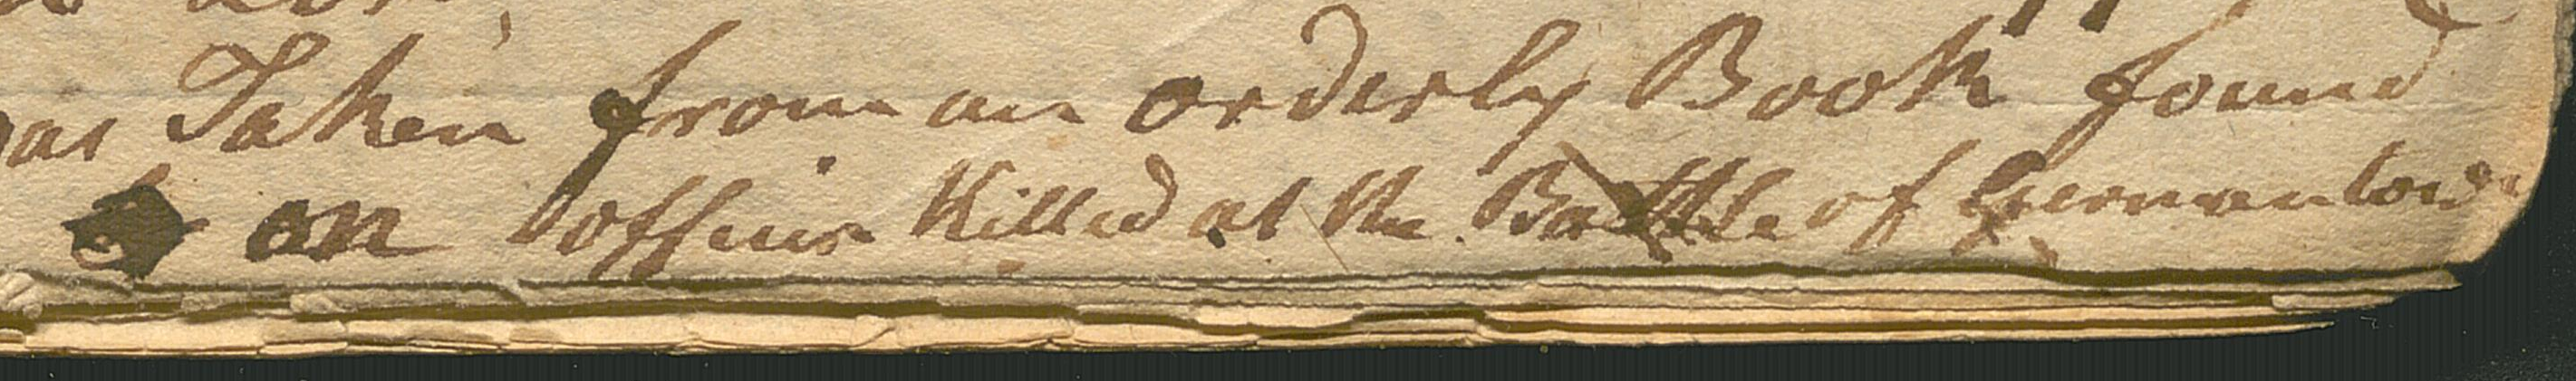[by] an officer Killed at the Battle of Germantown
